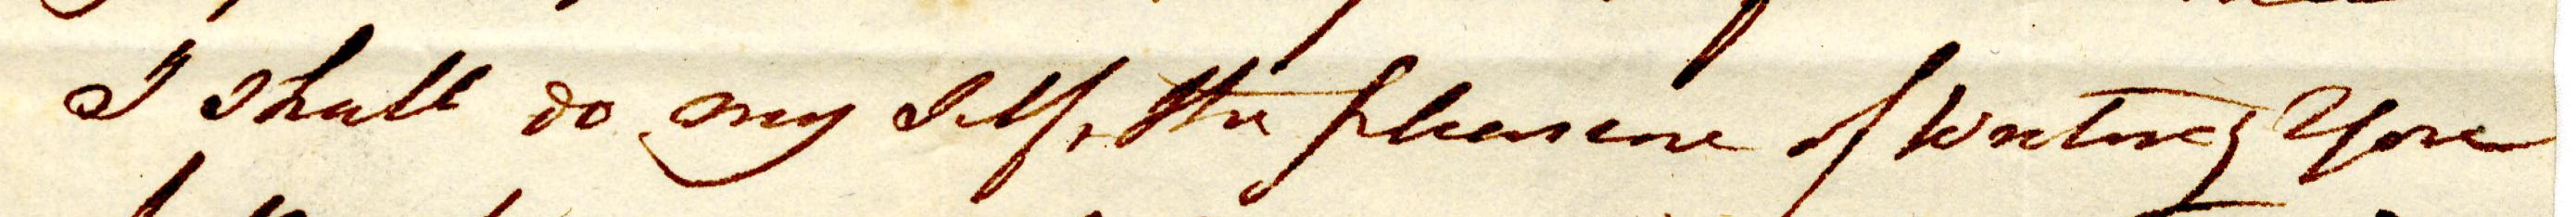I shall do my self, the pleasure of writing you
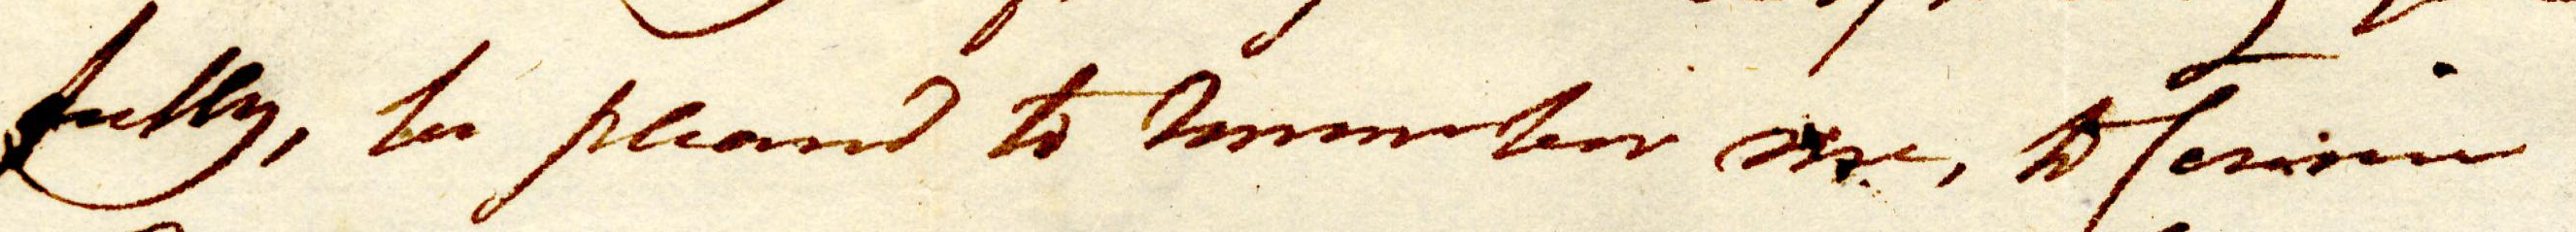fully, be pleased to remember me, to Cosinne
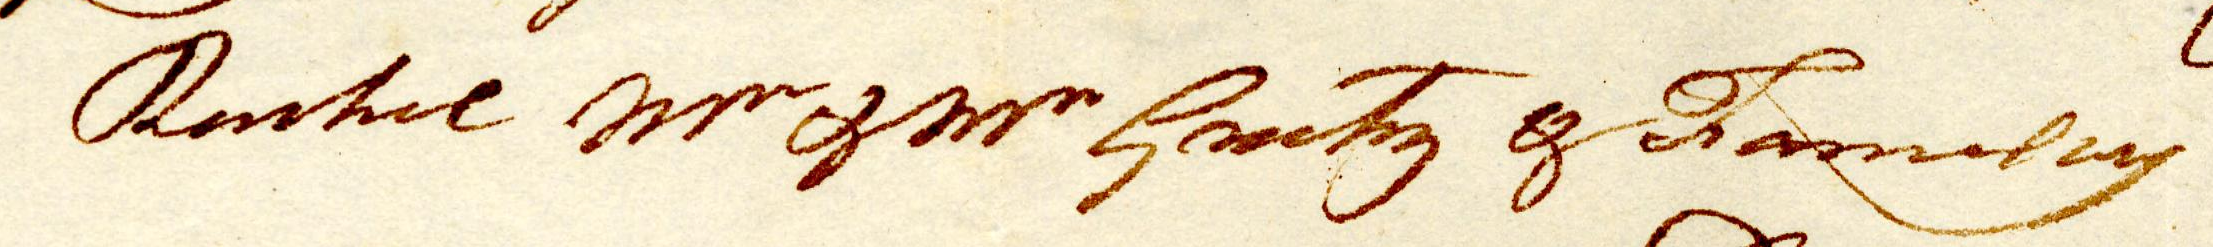Rachel M^r & M^rs Gratz & Family
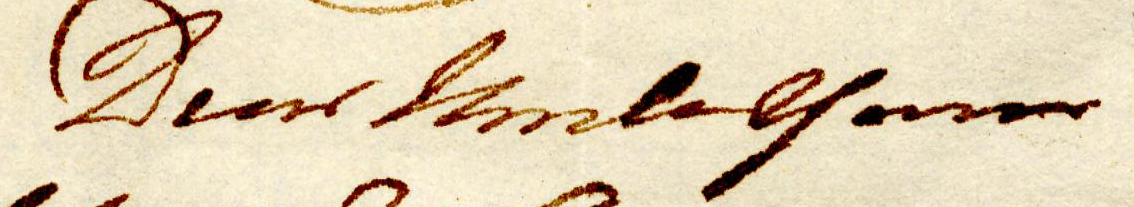Dear Uncle your
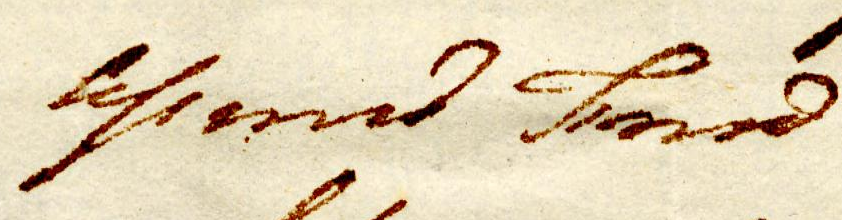assured Friend
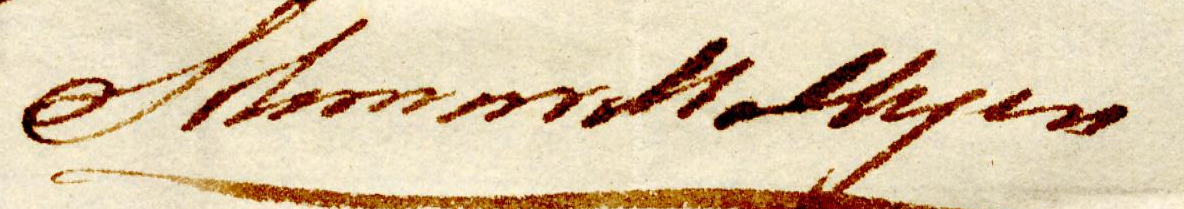Solomon M Myers
